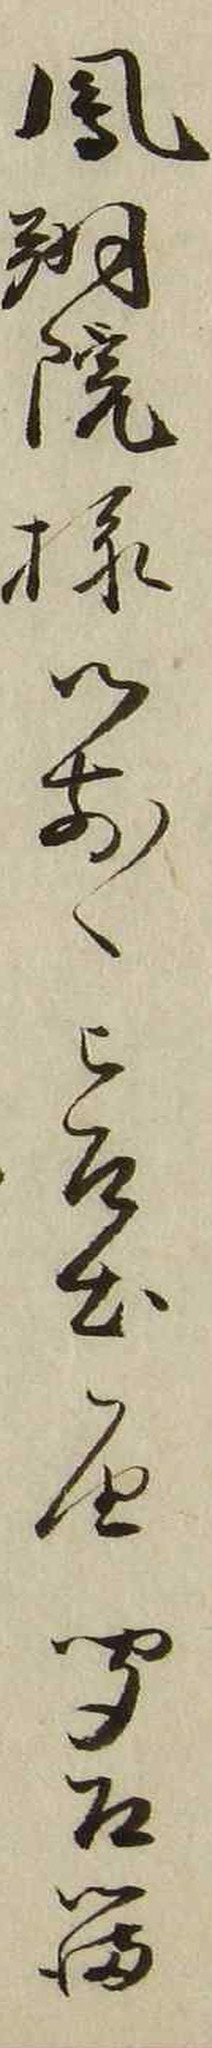鳳朔院様御前へ罷出候由聞召御満
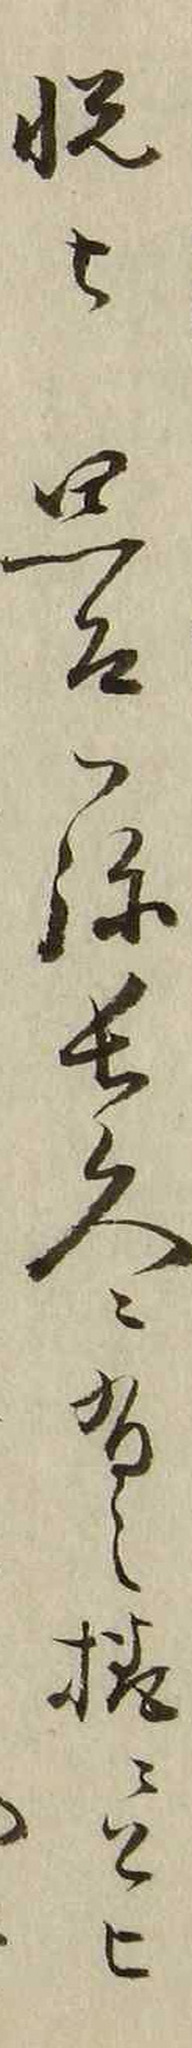悦被思召候弥長久に有之様にと被
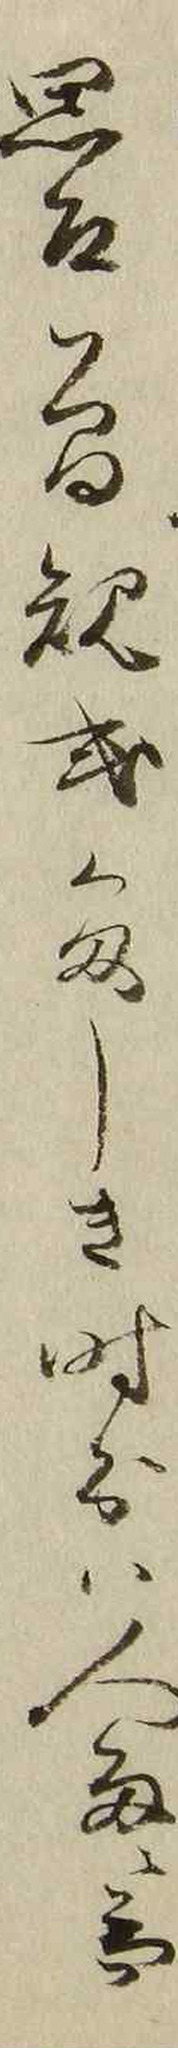思召候間規式くはしき時分は人多候而
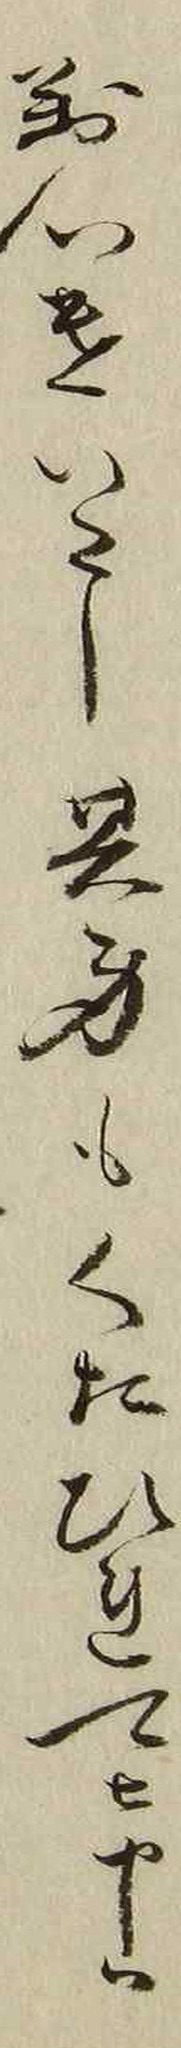萬心遣いたし其身もくたびれ可被申候
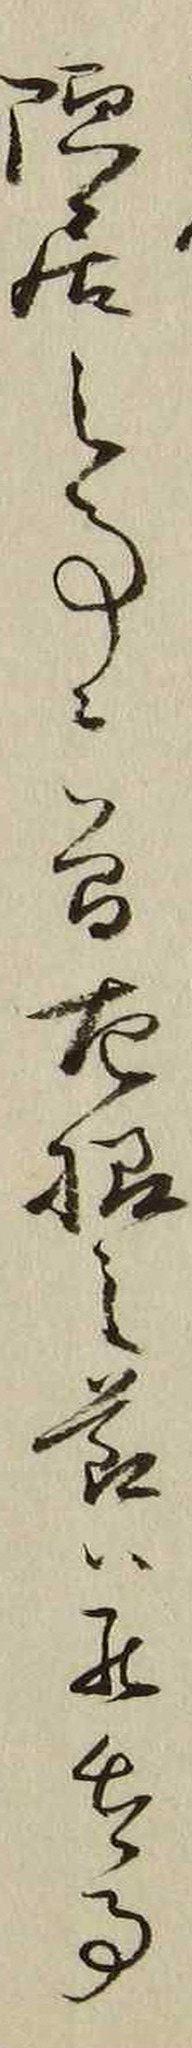隠居之事に候間左様之節は罷出候事
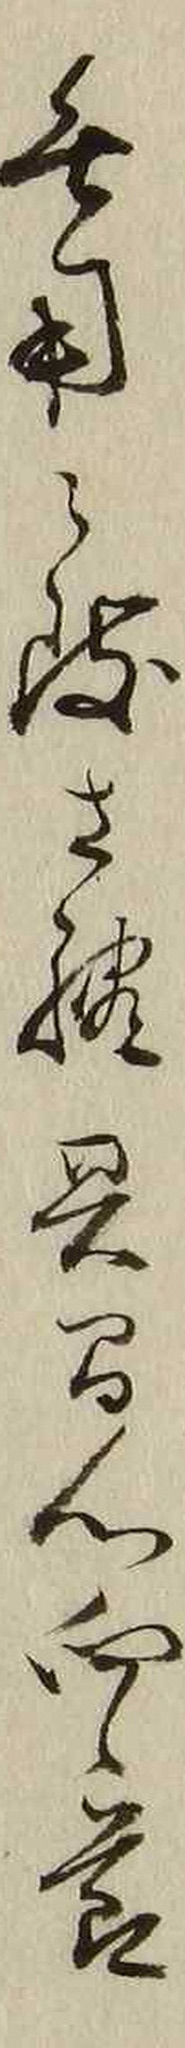無用に致され其間心向候節
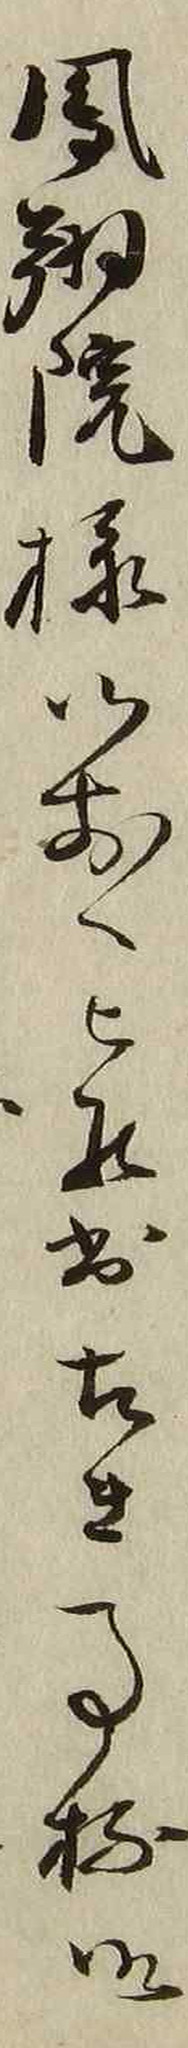鳳朔院様御前へ被罷出出き事抔御
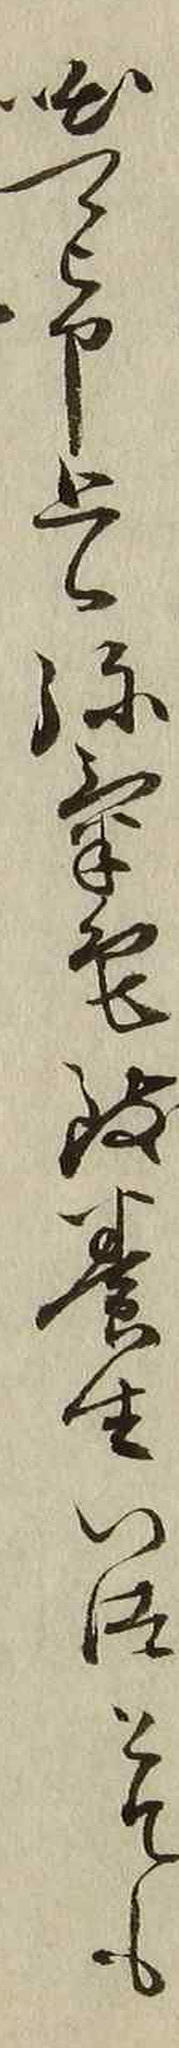咄可被申上候弥気色致養生いつとても
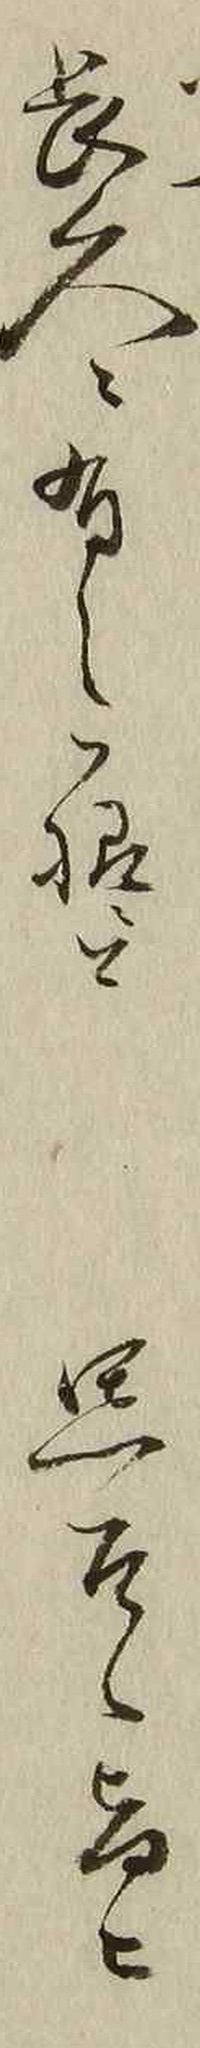長久に有之候様被思召候旨被
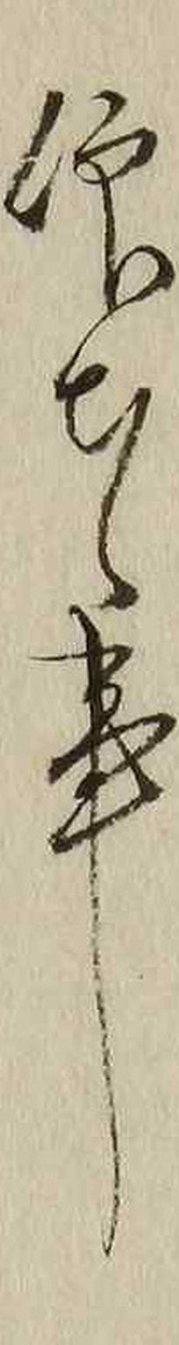仰出候事
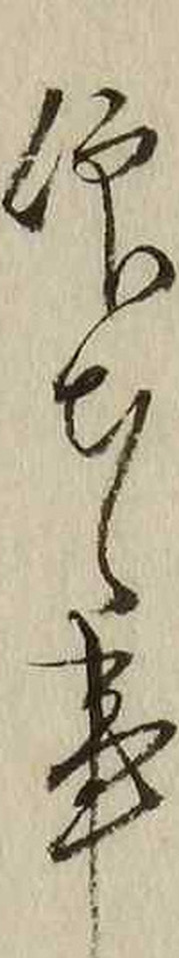仰出候事
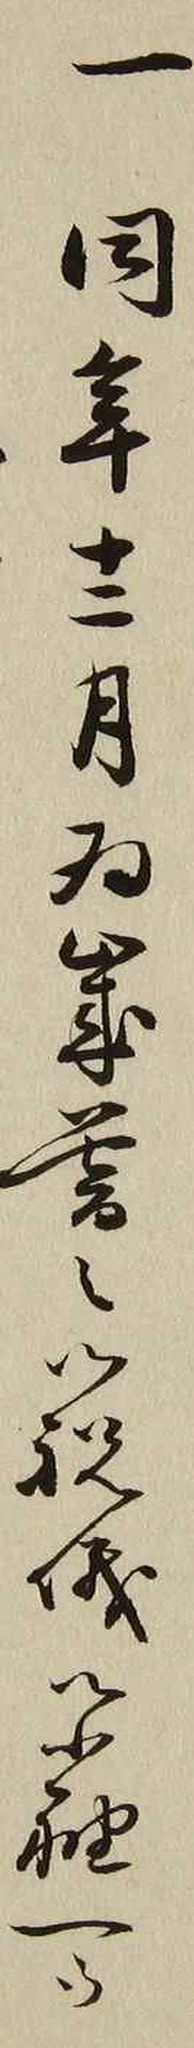一同年十二月為歳暮之御祝儀御子袖一つ
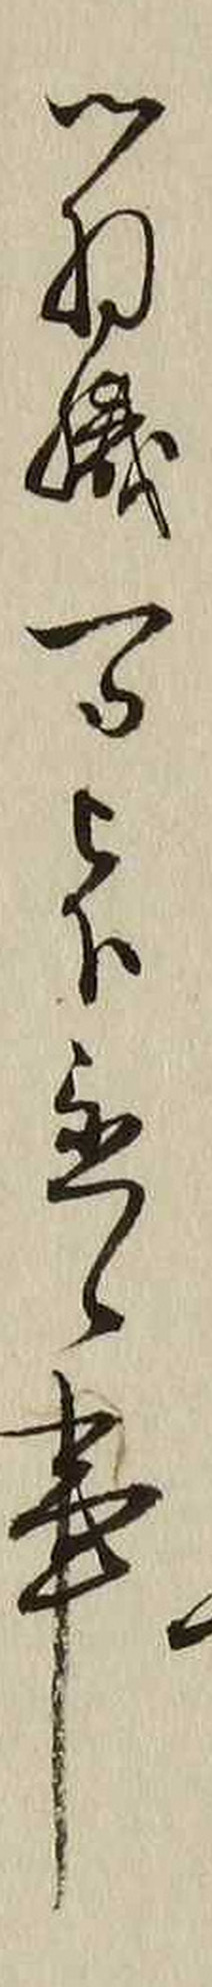御羽織一つ被下置候事
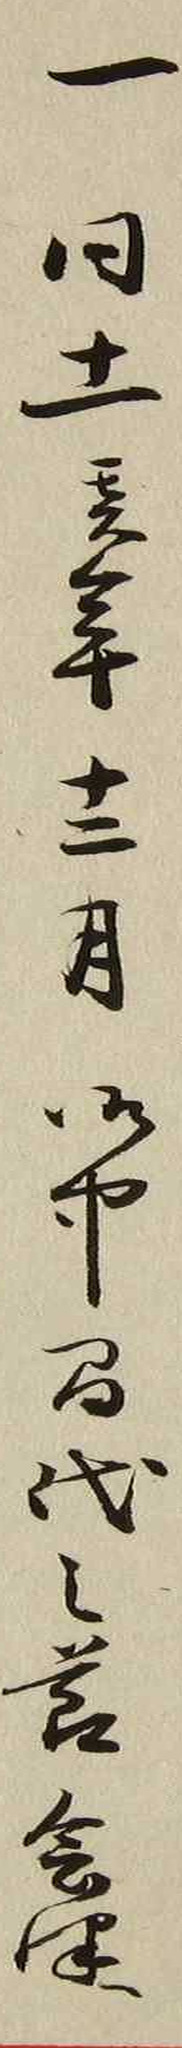一同十一亥年十二月御中間代之節会津
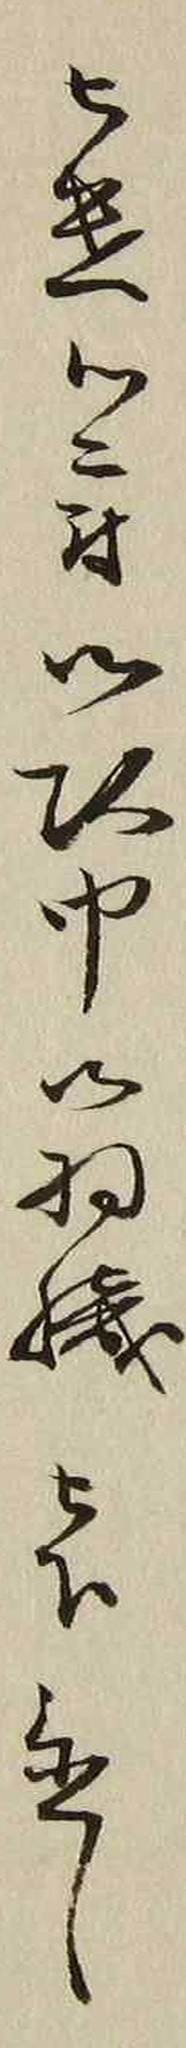被遣候に付御頭巾御羽織被下置候
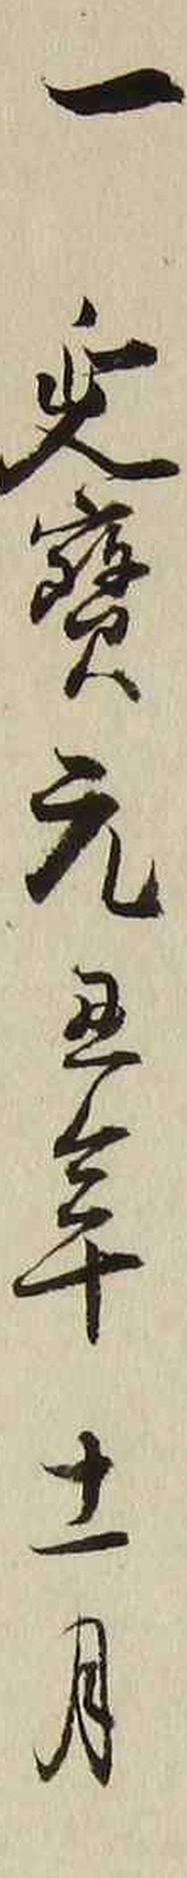一延宝元丑年十一月
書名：諸士系譜　巻之292　き之部1
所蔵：会津若松市立会津図書館
